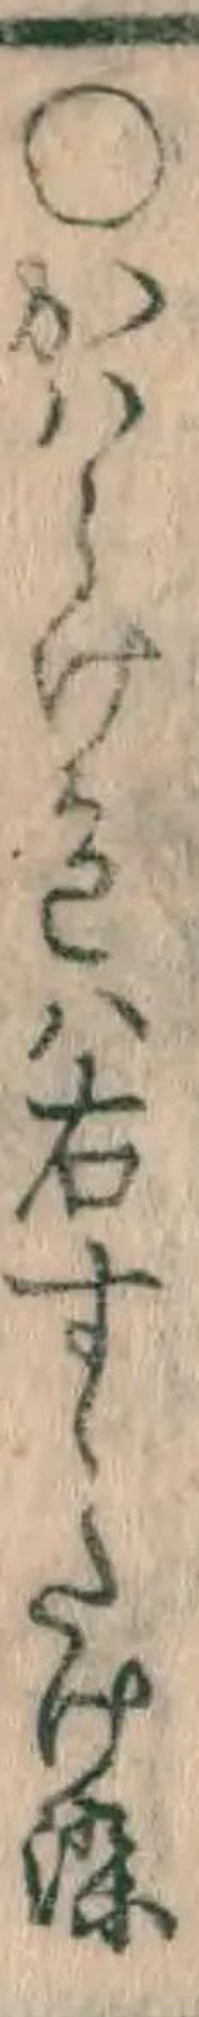○かはらけ色は右すゝたけ染
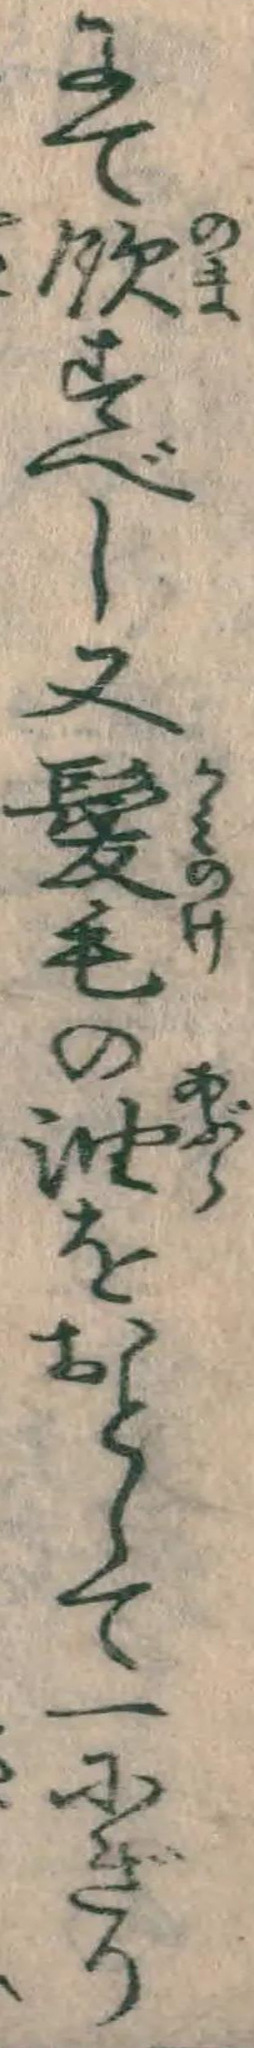にて飲すべし又髪毛の油をおとして一にぎり
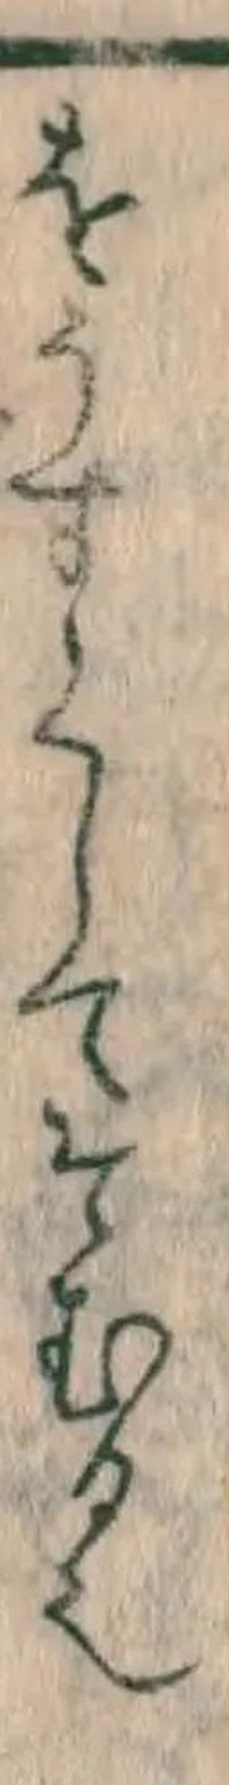をうすくしてそむる也
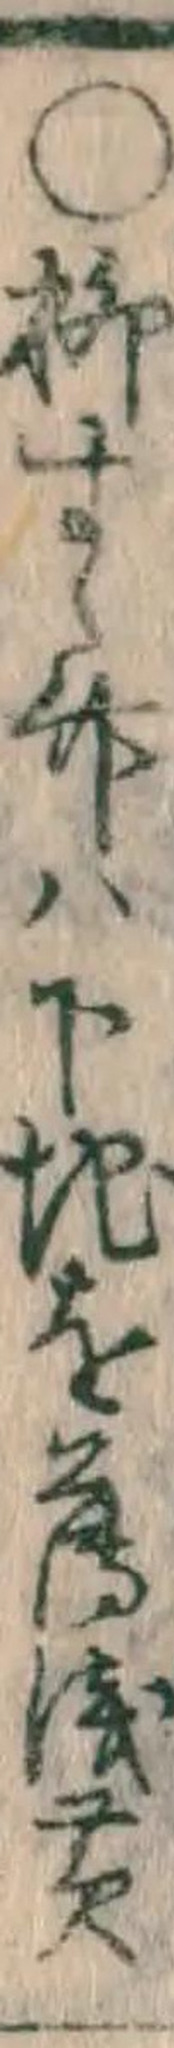○柳すゝ竹は下地を薄浅黄
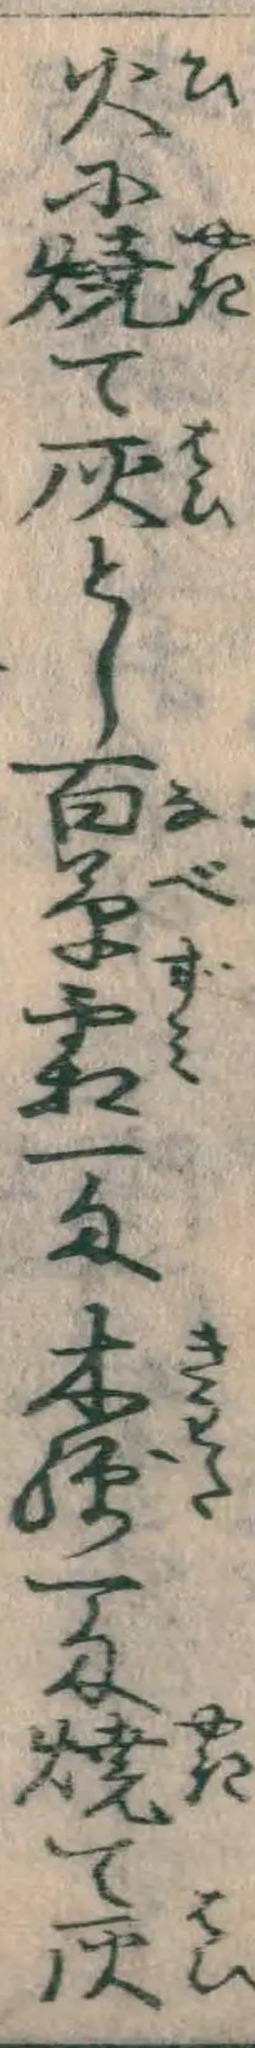火に焼て灰とし百草霜一匁木綿一匁焼て灰
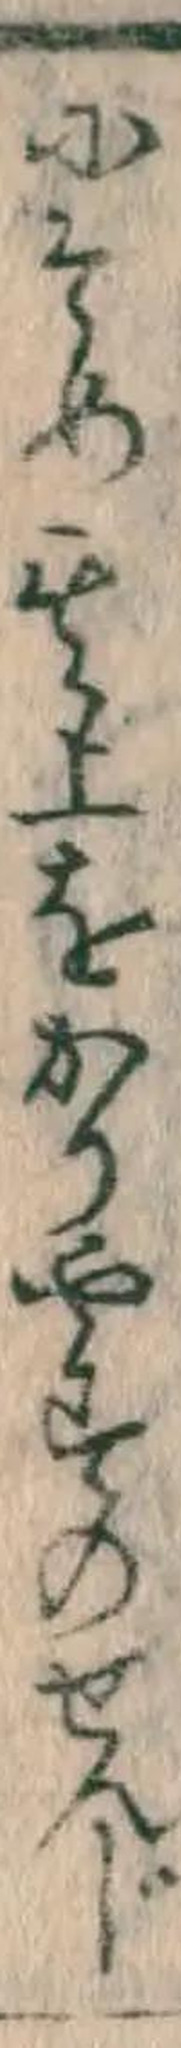にそめ其上をかりやすのせんじ
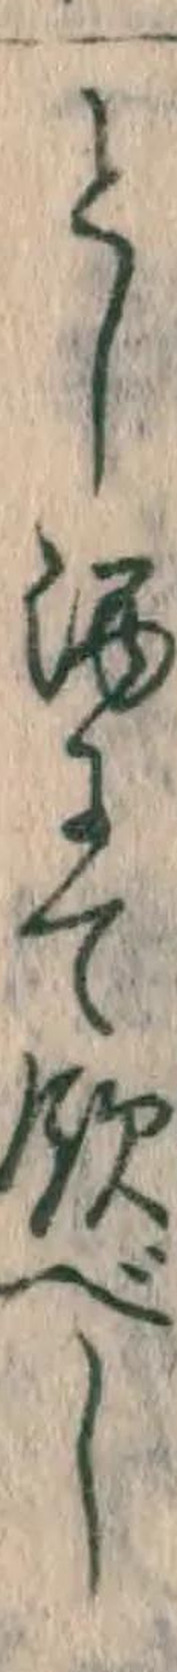とし酒にて飲べし
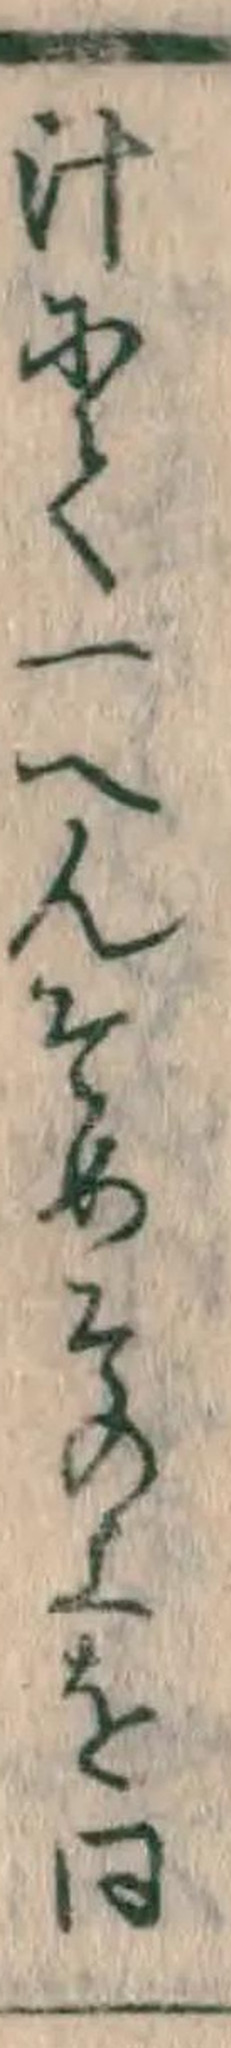汁にて一へんそめその上を同
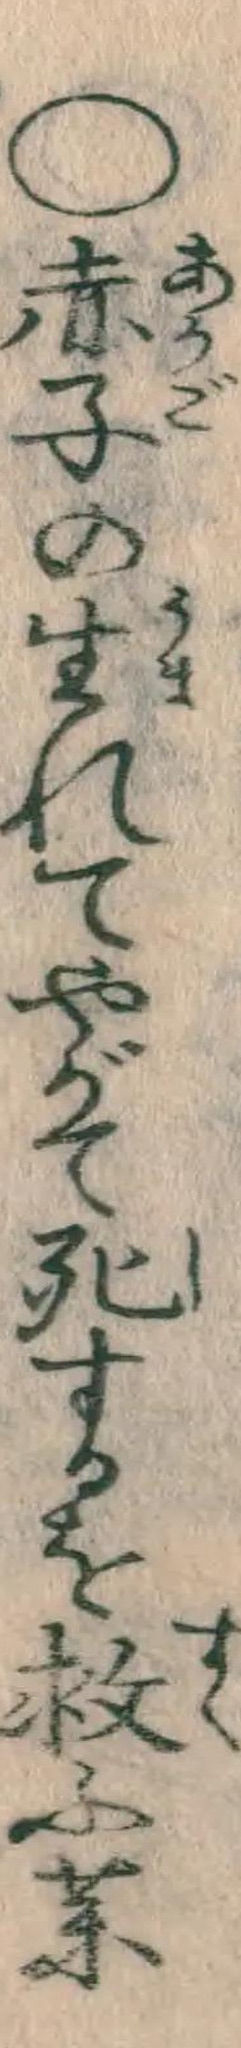○赤子の生れてやがて死するを救ふ薬
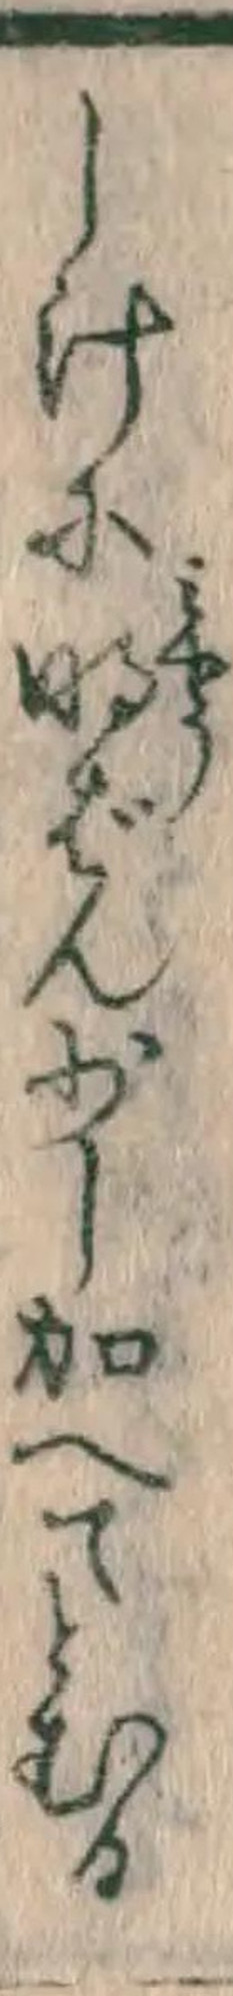し汁に明ばん少し加へてとむる
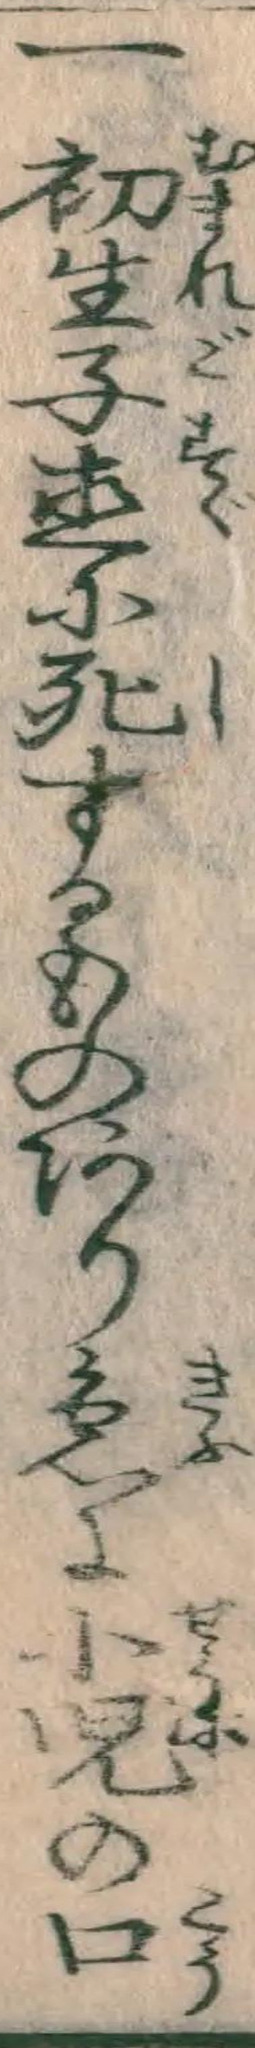一初生子速に死するものあり急に小児の口
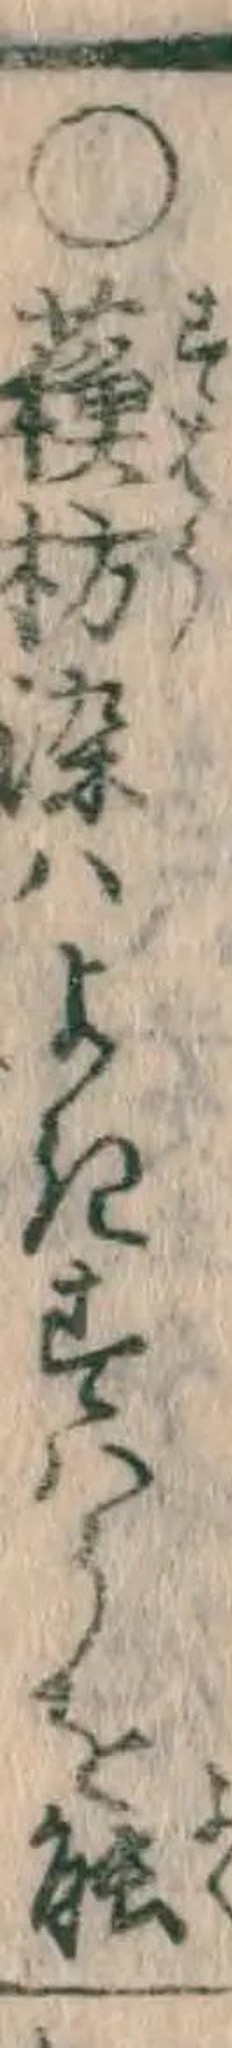○蘓枋染はよきすはうを能
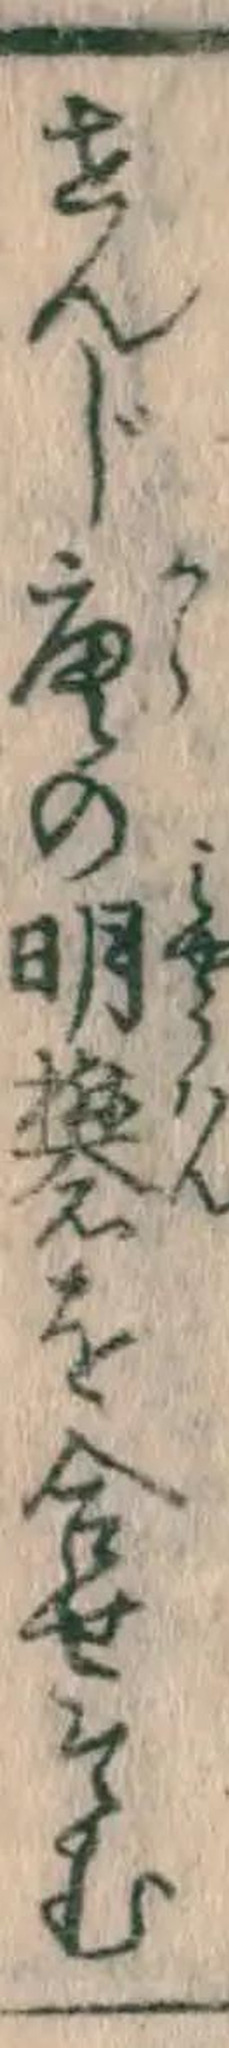せんじ唐の明礬を合せそむ
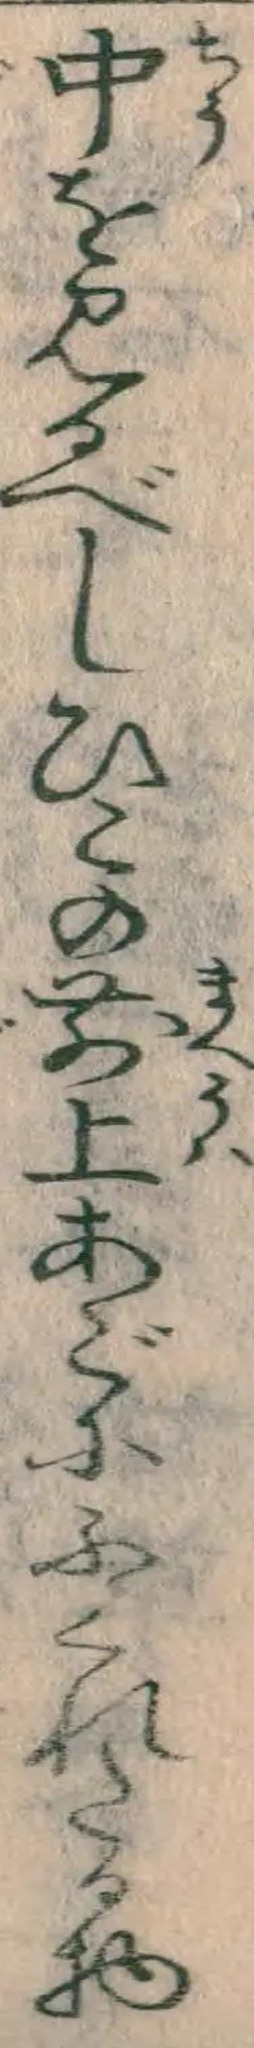中を見るべしひこの前上あごにふくれたる物
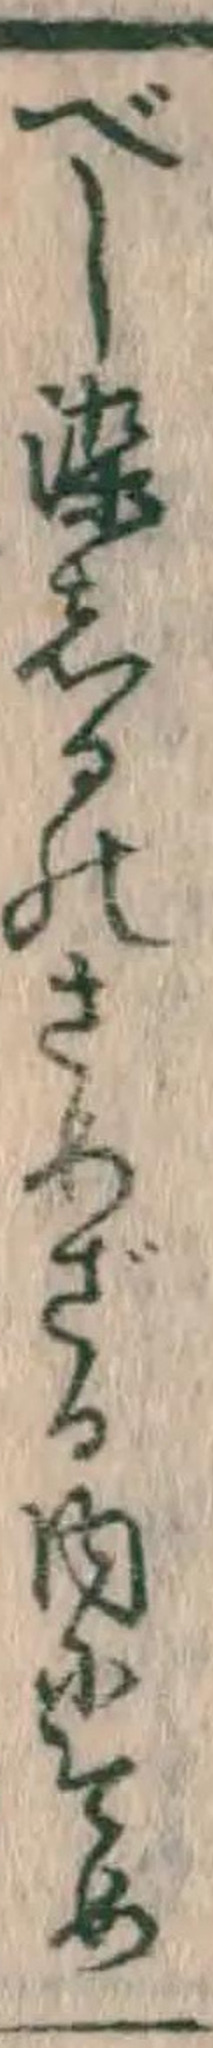べし染しるのさめざる内にそめ
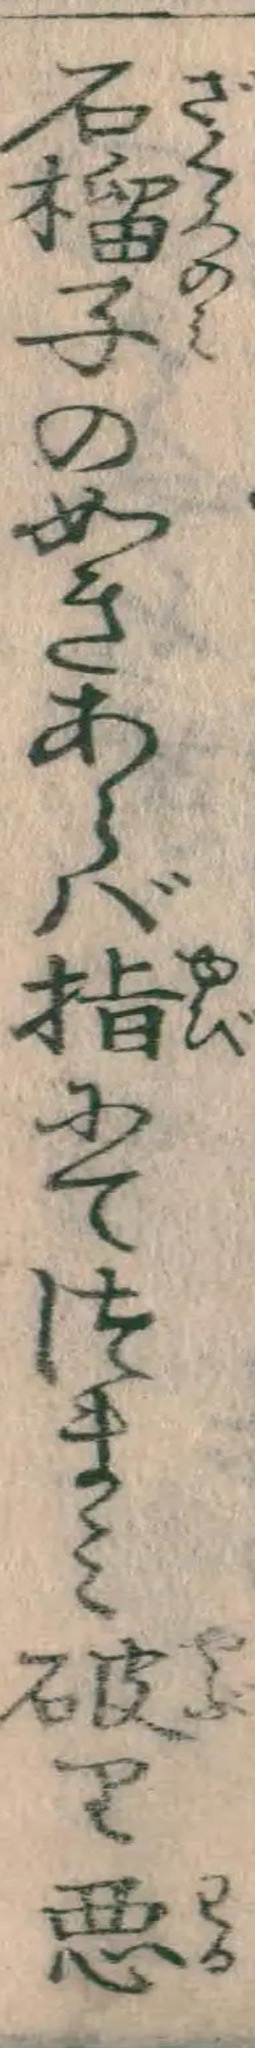石榴子の如きあらば指にてつまみ破り悪
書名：広益秘事大全 3巻. [3]
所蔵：国立国会図書館 National Diet Library, JAPAN
